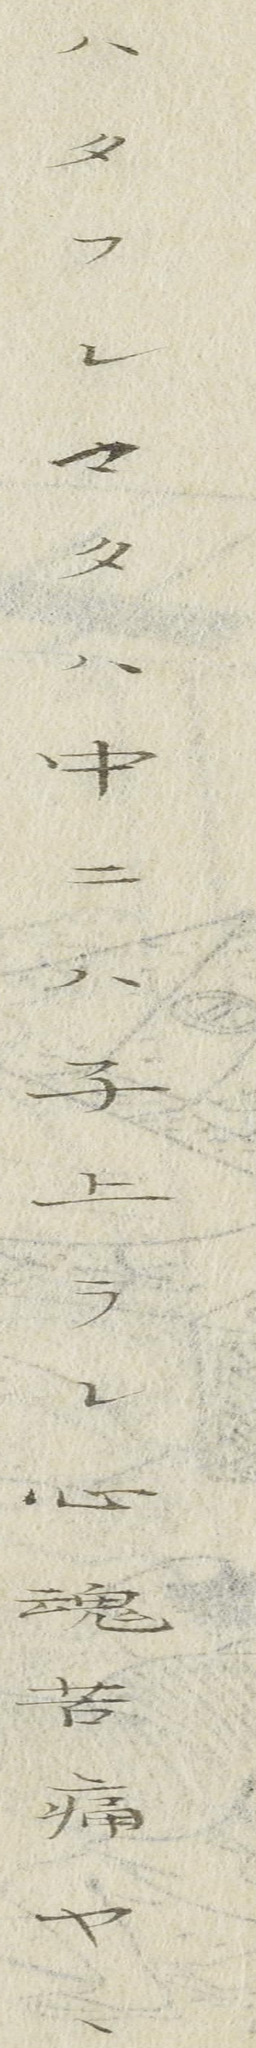ハタフレマタハ中ニハ子上ラン心魂苦痛ヤヽ
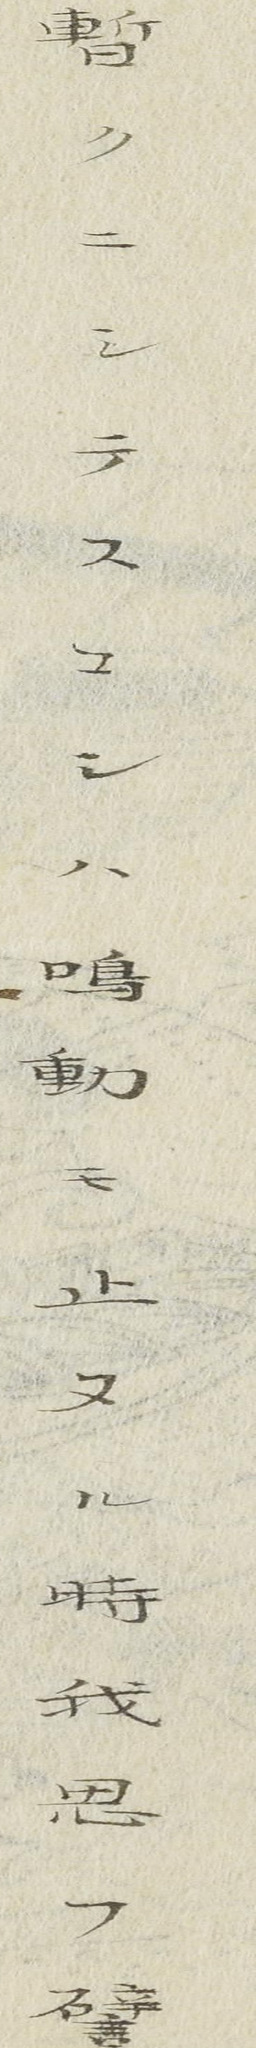暫クニシテスコシハ鳴動モ止ヌル時我思フ譬
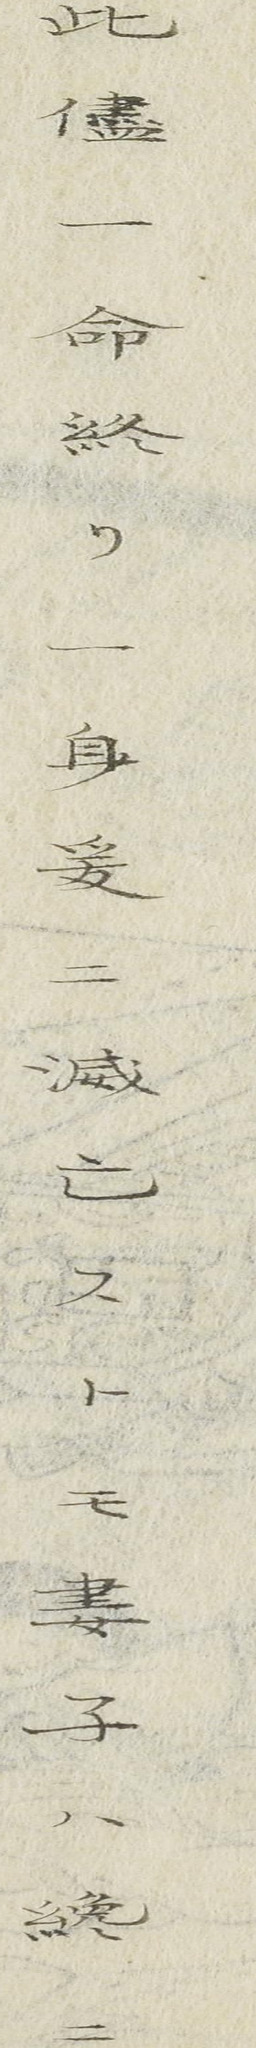此侭一命終リ一身爰ニ滅亡ストモ妻子ハ纔ニ
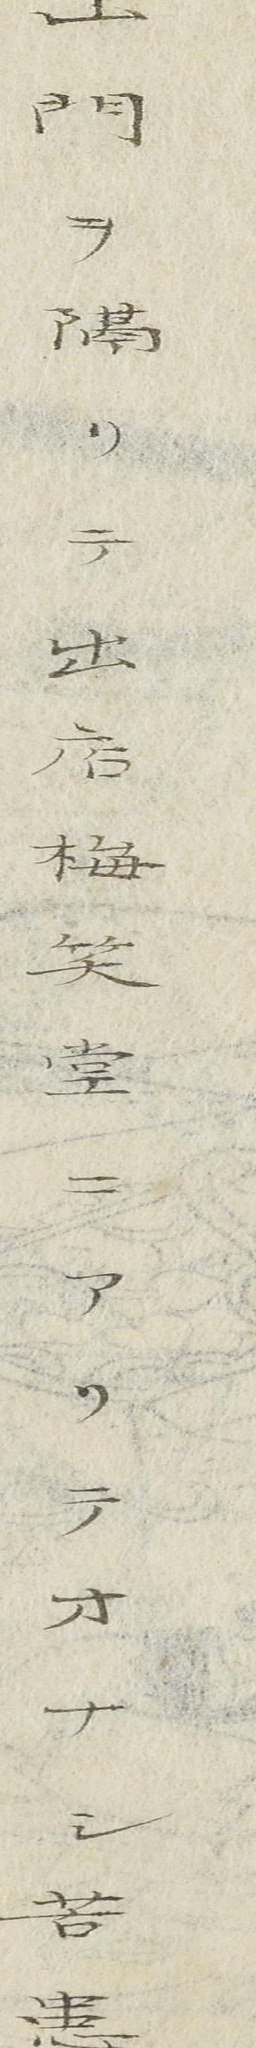山門ヲ隔リテ出店梅笑堂ニアリテオナシ苦患
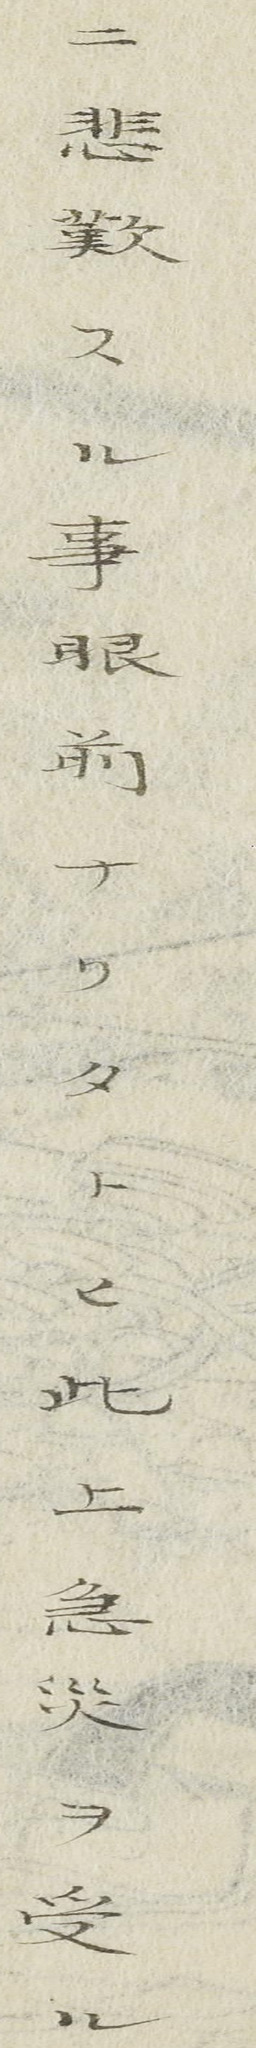ニ悲歎スル事眼前ナリタトヒ此上急災ヲ受ル
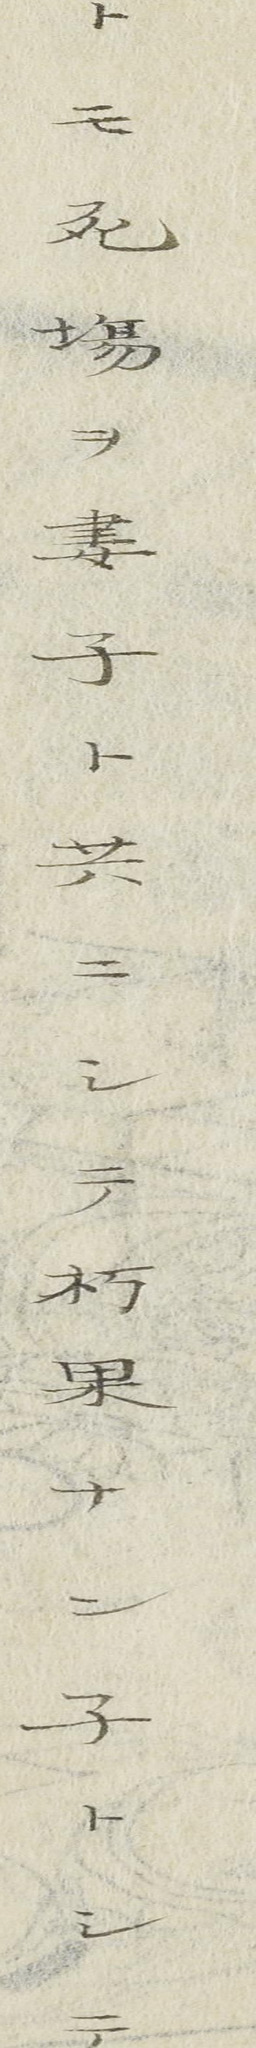トモ死場ヲ妻子ト共ニシテ朽果ナン子トシテ
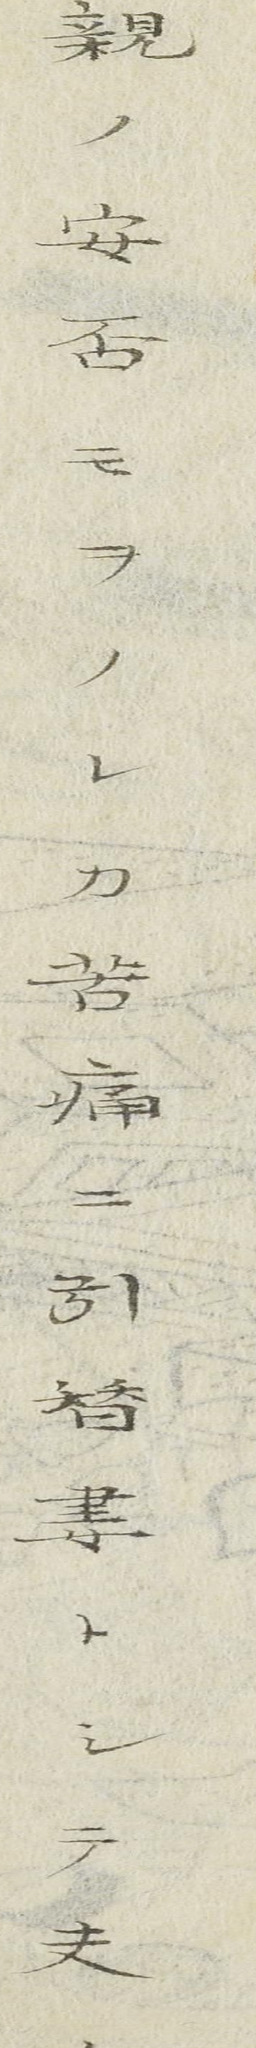親ノ安否モヲノレカ苦痛ニ引替妻トシテ夫ノ
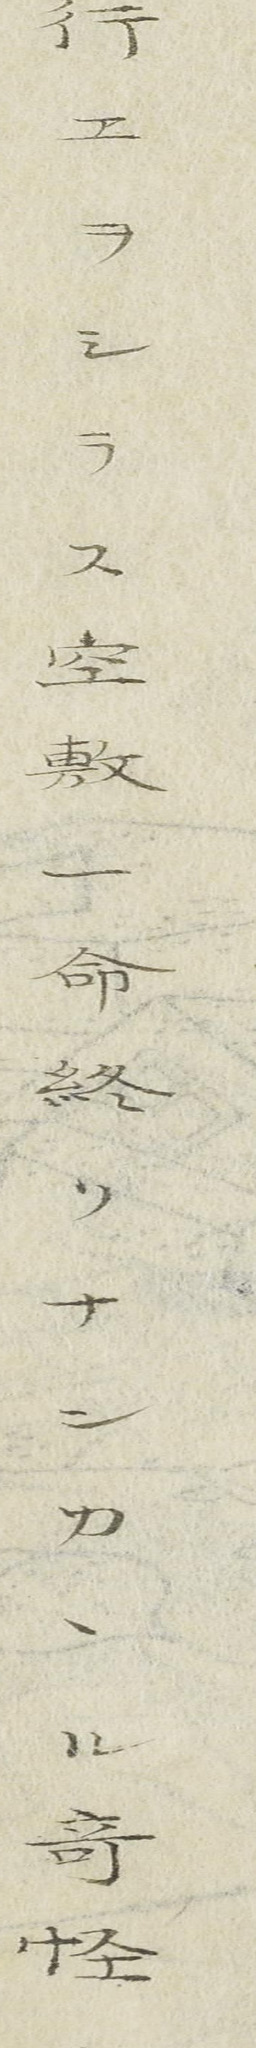行エヲシラス空敷一命終リナンカヽル奇怪ノ
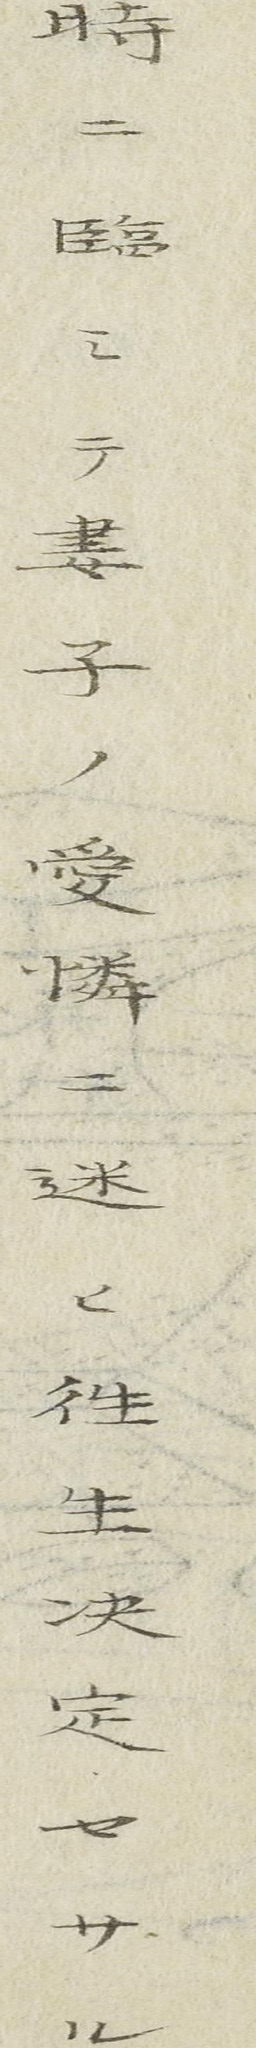時ニ臨ミテ妻子ノ愛憐ニ迷ヒ往生決定セサル

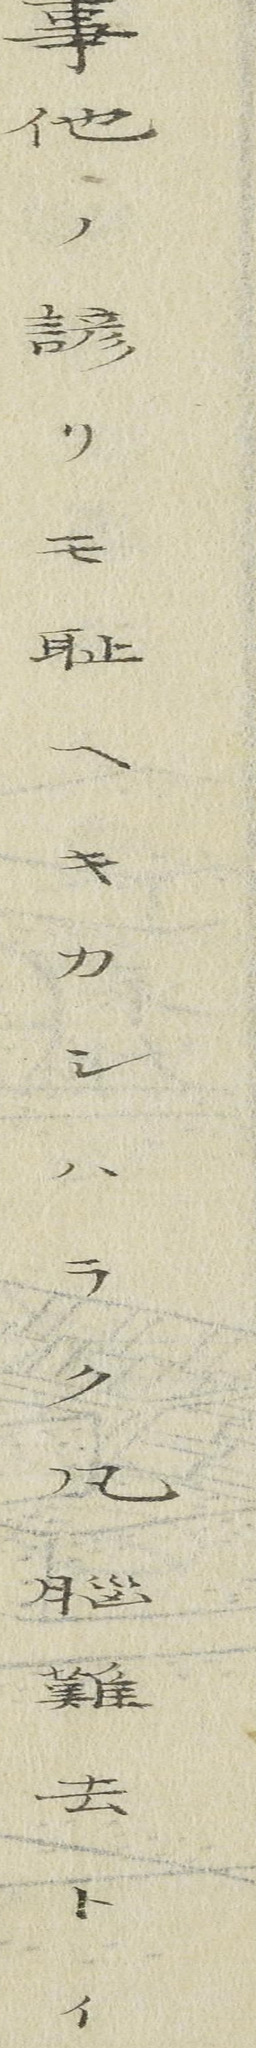事他ノ諺リモ恥ヘキカシハラク凡脳難去トイ
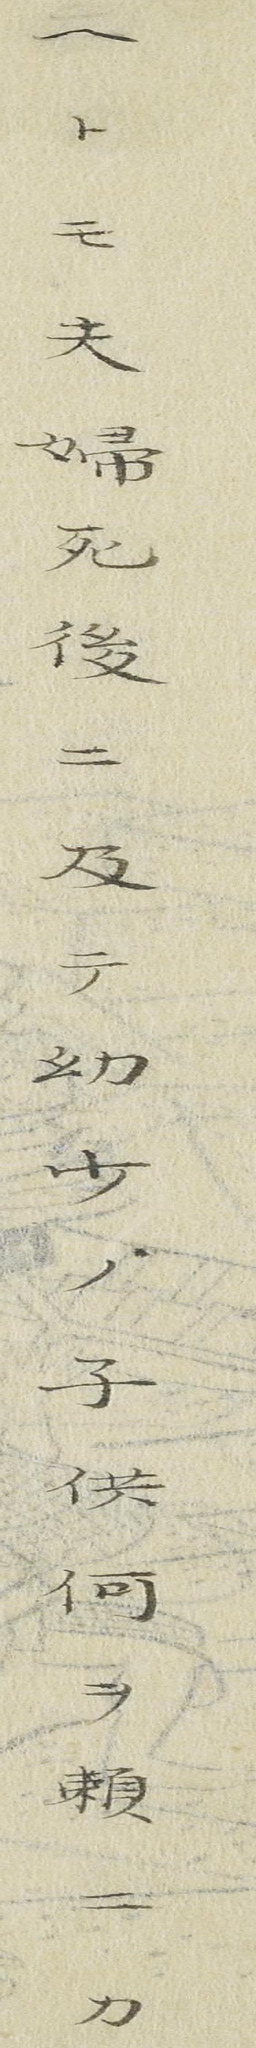ヘトモ夫婦死後ニ及テ幼少ノ子供何ヲ頼ニカ
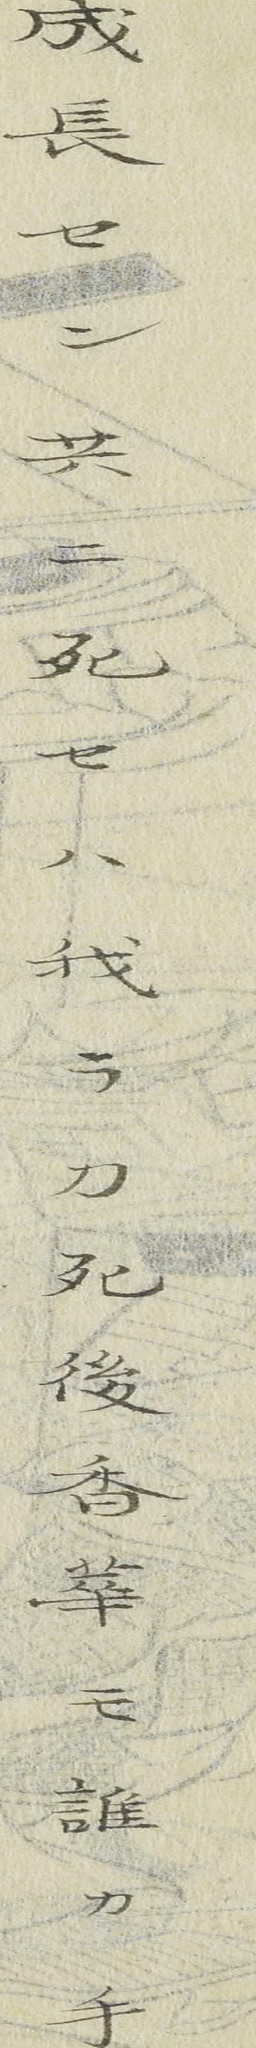成長セン共ニ死セハ我ラカ死後香華モ誰カ手
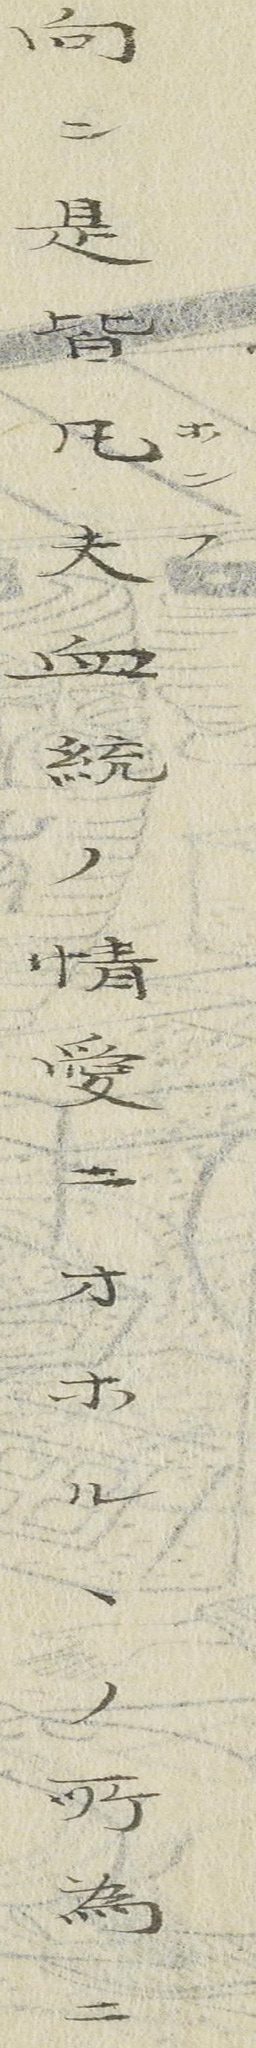向ン是皆凡夫血統ノ情愛ニオホルヽノ所為ニ
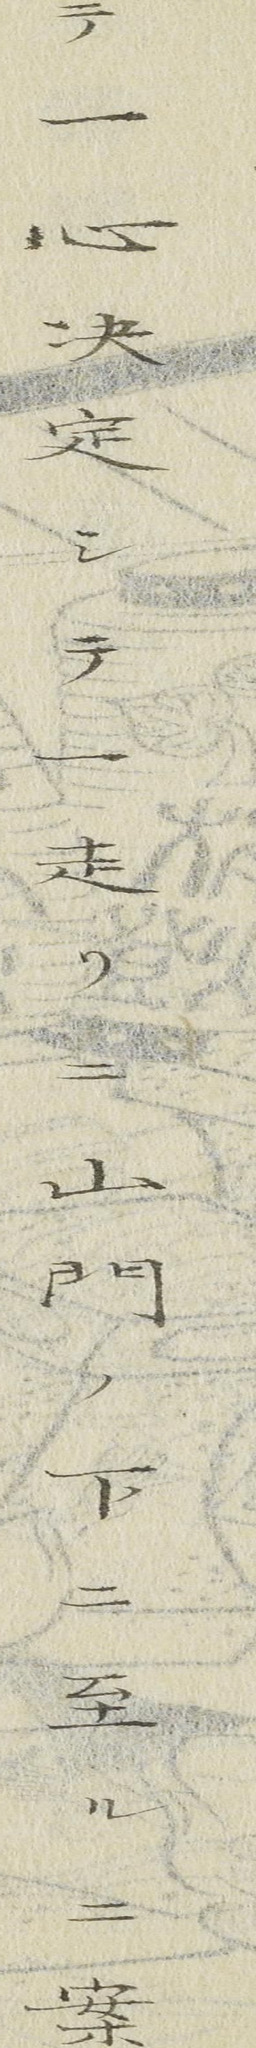テ一心決定シテ一走リニ山門ノ下ニ至ルニ案
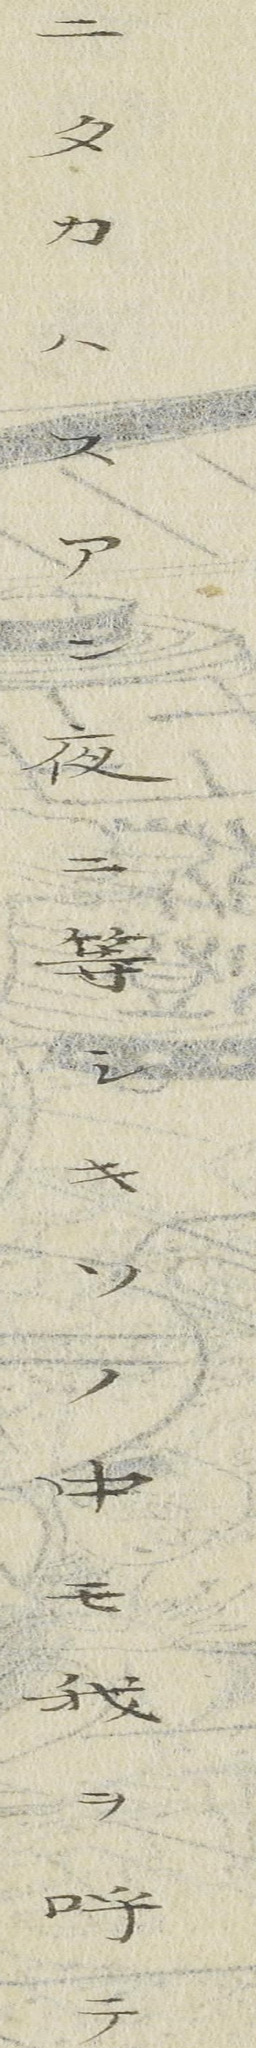ニタカハスアン夜ニ等シキソノ中モ我ヲ呼テ
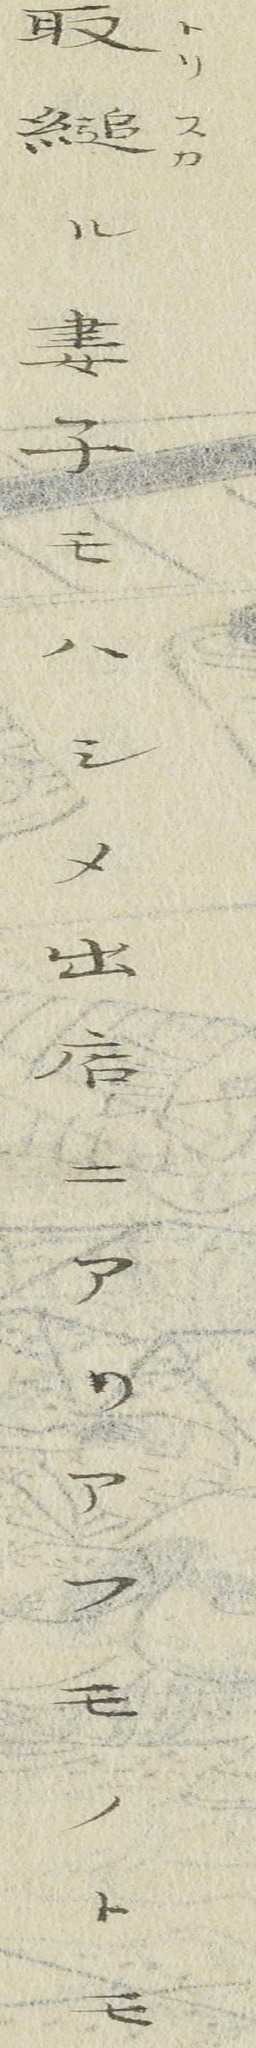取縋ル妻子モハシメ出店ニアリアフモノトモ
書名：地災撮要　地震之部　巻ノ二
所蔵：東京大学地震研究所図書室 Earthquake Research Institute Library, The University of Tokyo, JAPAN
